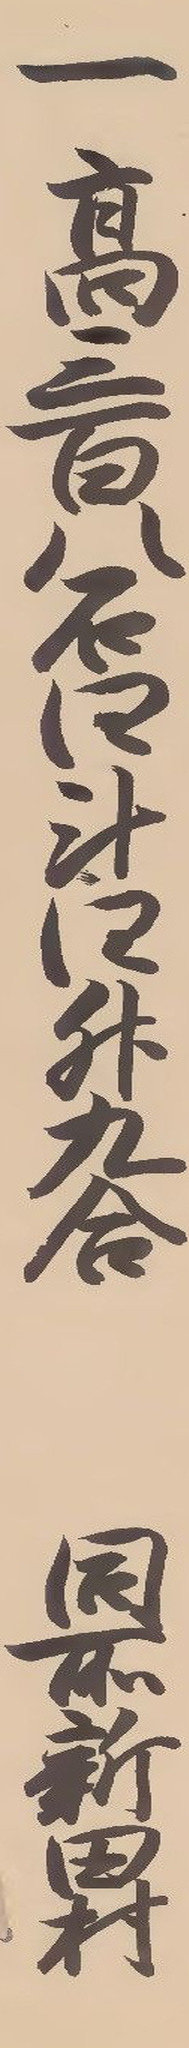一高三百八石四斗四升九合同所新田村
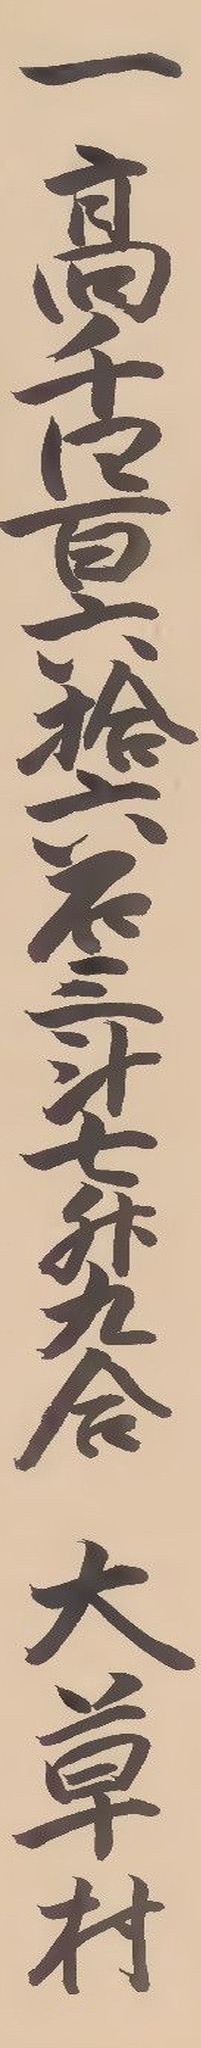一高千四百六拾六石三斗七升九合大草村
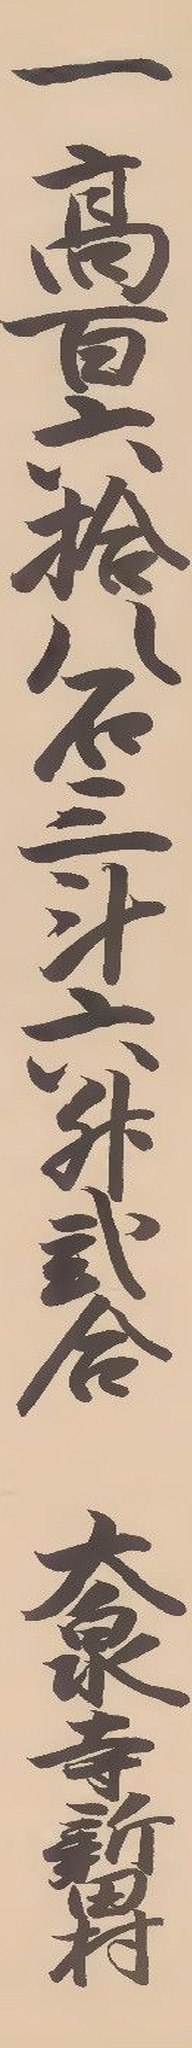一高百六拾八石三斗六升弐合大泉寺新田村
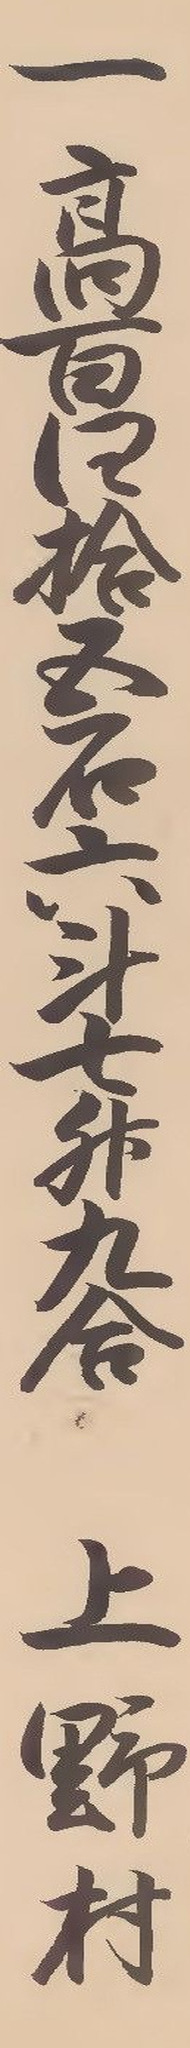一高百四拾五石六斗七升九合上野村
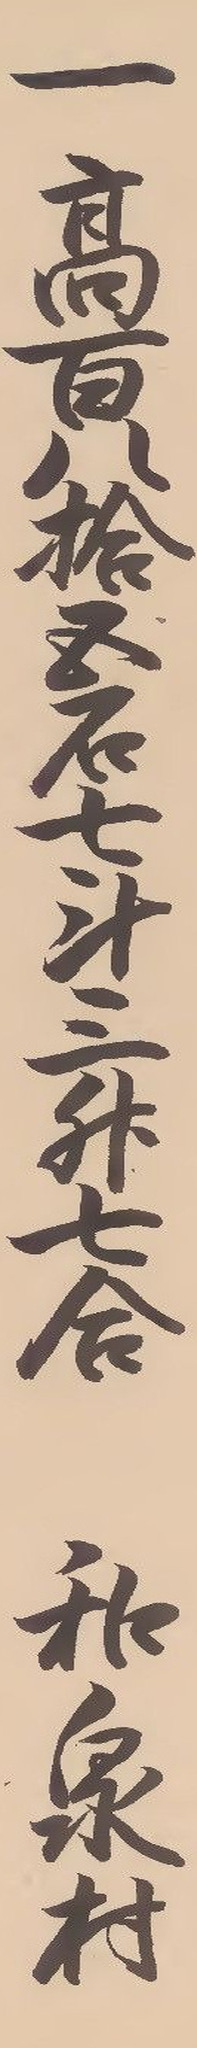一高百八拾五石七斗三升七合和泉村
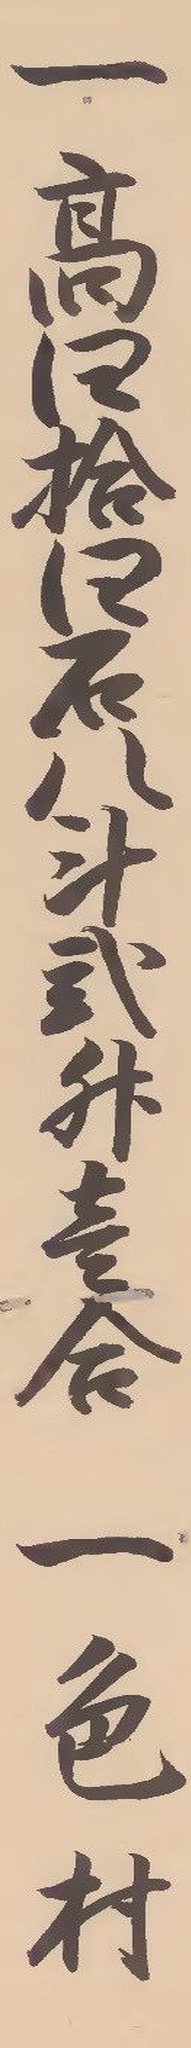一高四拾四石八斗弐升壱合一色村

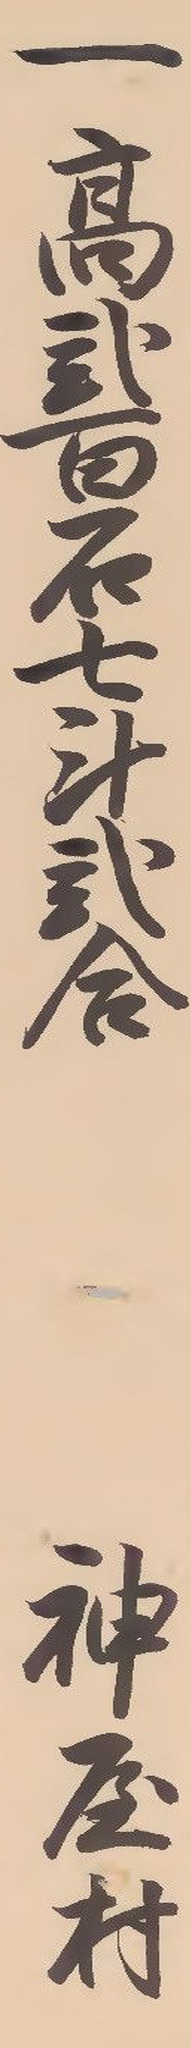一高弐百石七斗弐合神屋村
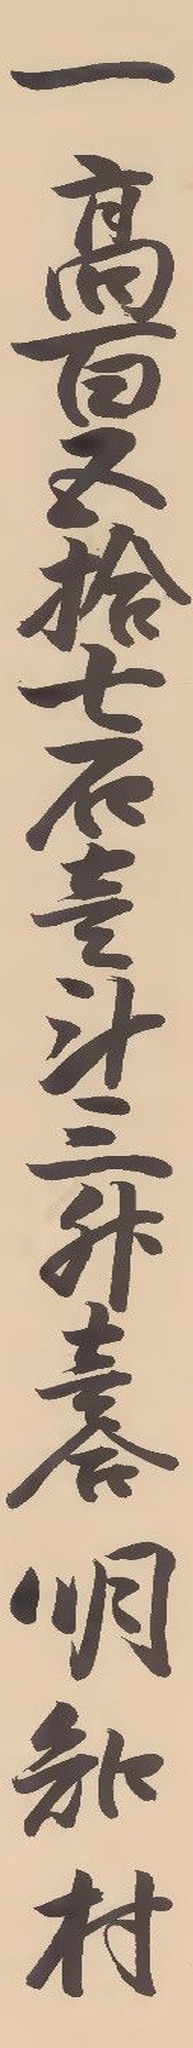一高百五拾七石壱斗三升壱合明知村
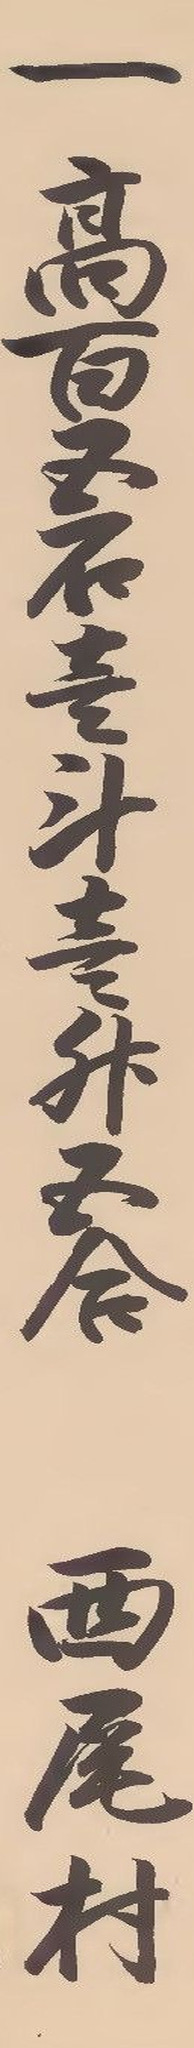一高百五石壱斗壱升五合西尾村
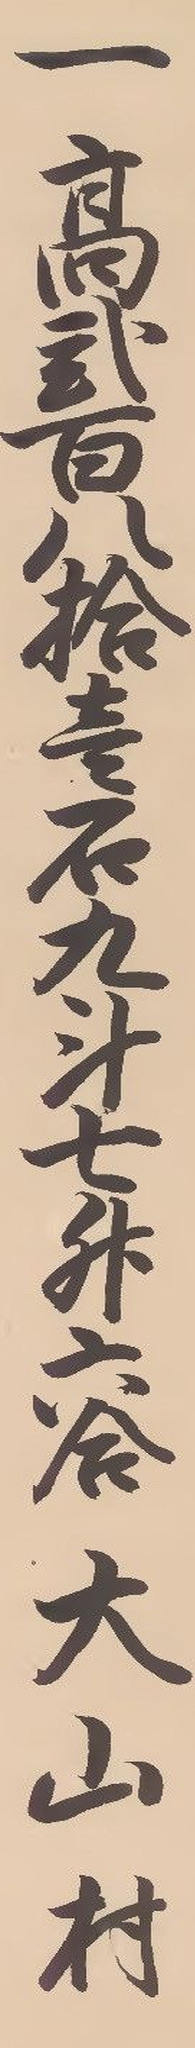一高弐百八拾壱石九斗七升六合大山村
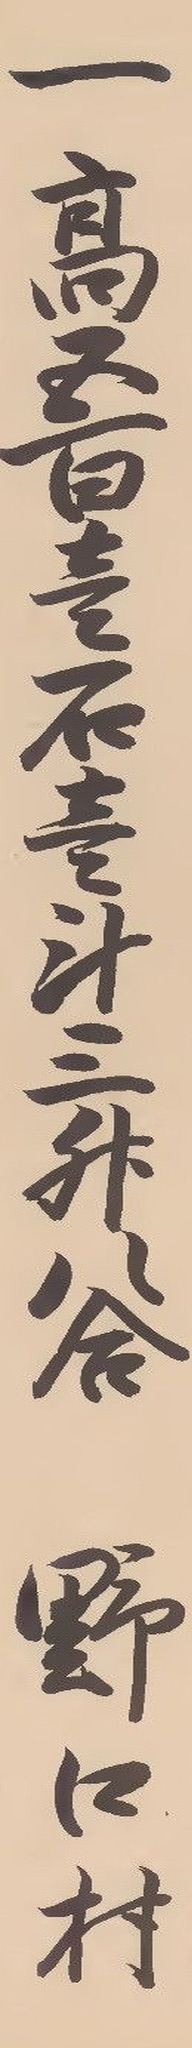一高五百壱石壱斗三升八合野口村
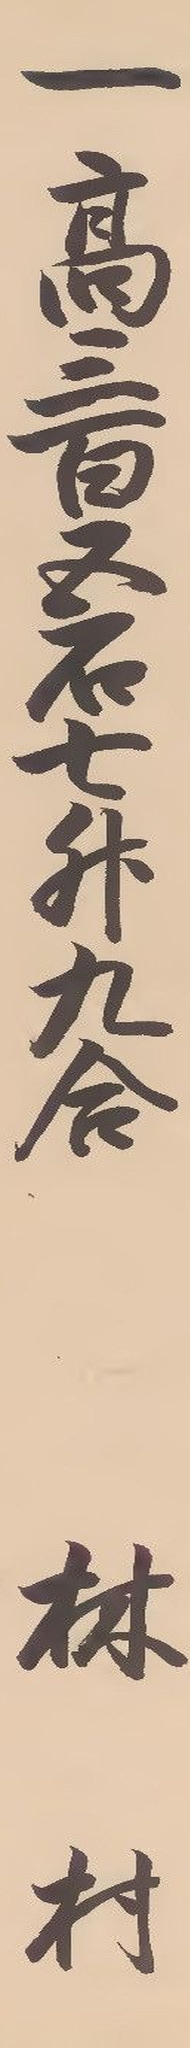一高三百五石七升九合林村
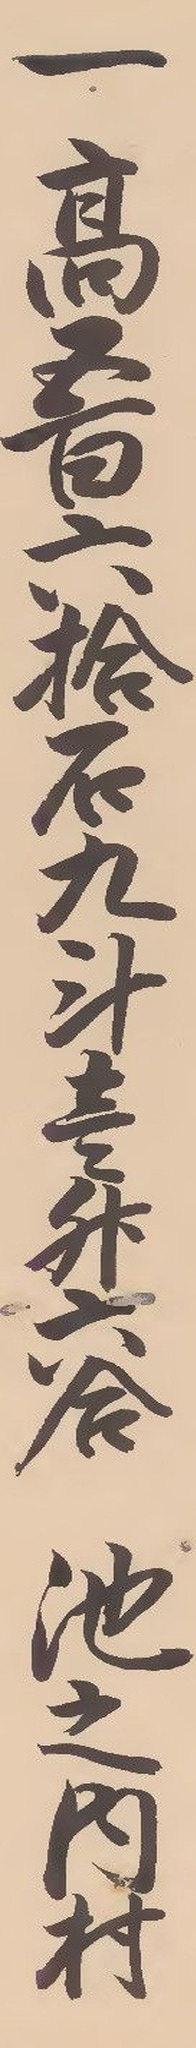一高五百六拾石九斗壱升六合池之内村

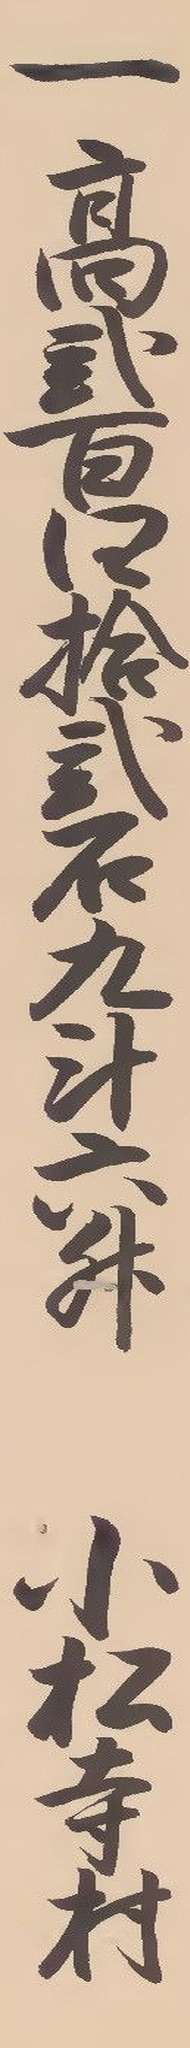一高弐百四拾弐石九斗六升小松寺村
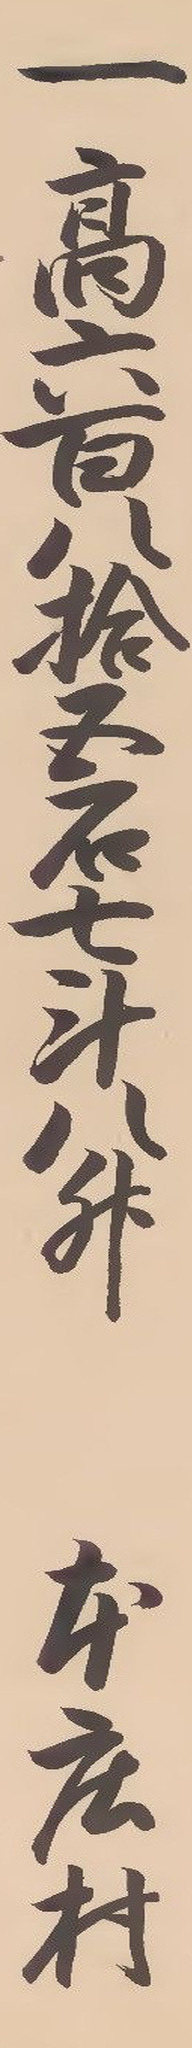一高六百八拾五石七斗八升本庄村
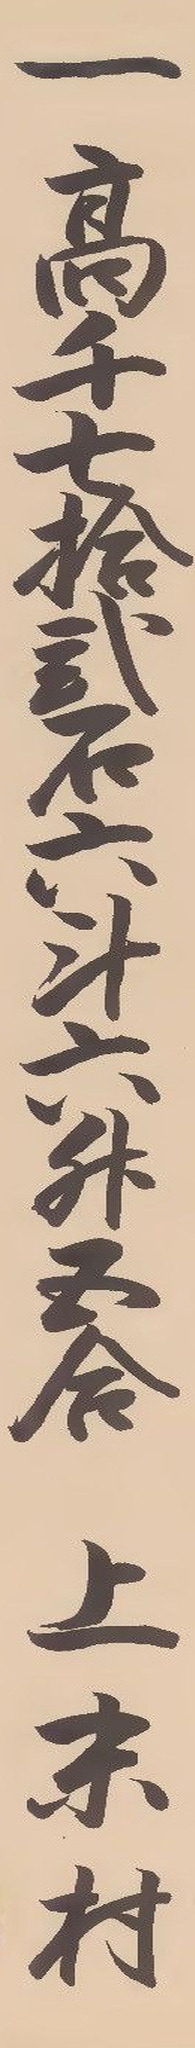一高千七拾弐石六斗六升五合上末村
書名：尾張国郷帳
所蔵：国立公文書館 National Archives of Japan
